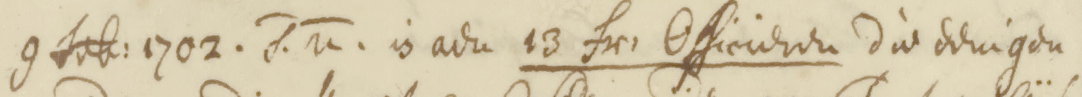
9 feb: 1702. s.n. is aen 13 fr. Officieren die eenigen
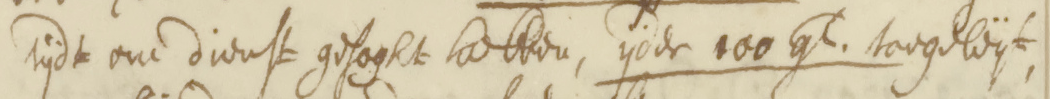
tijdt om dienst gesoght hebben, ijder 100 gl. toegeleijt
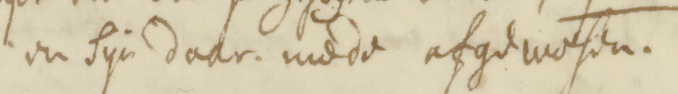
en sijn daer mede afgewesen.
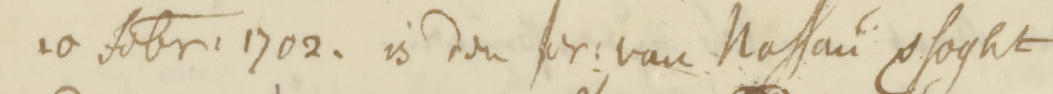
10 feb: 1702. is den Pr. van Nassau vsoght
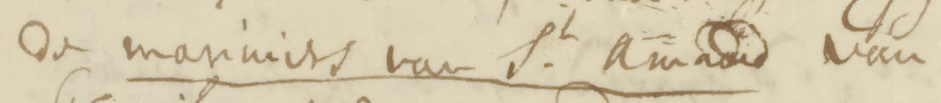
de mariniers van St. Amand van
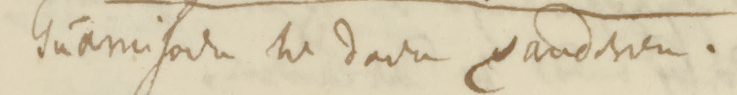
Guarnisoen te doen vanderen
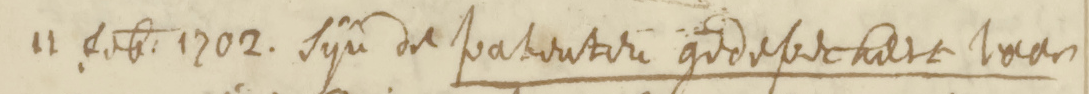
11 feb: 1702. sijn de patenten gedepecheert voor
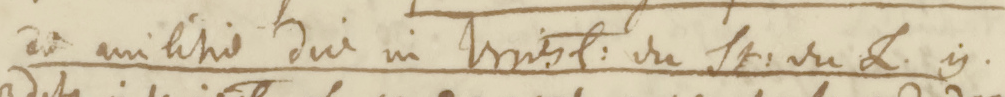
de militie die in Vriesl: en St: en L. is
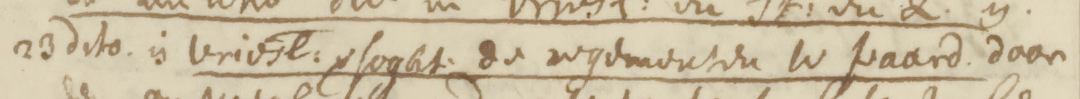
23 dito. is Vriesl: vsoght de regementen te paard door
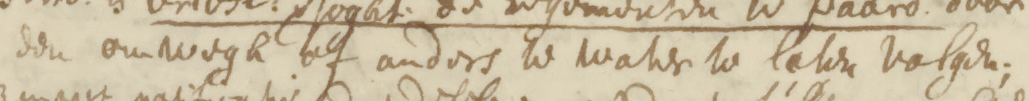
den omwegh of anders te water te laten volgen;
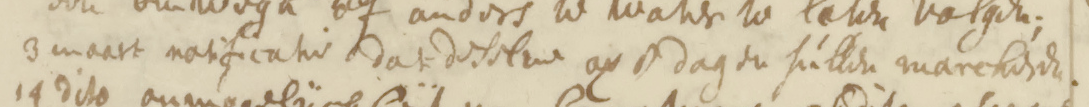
3 maart notificatie dat deselve op 8 dagen sullen marcheren
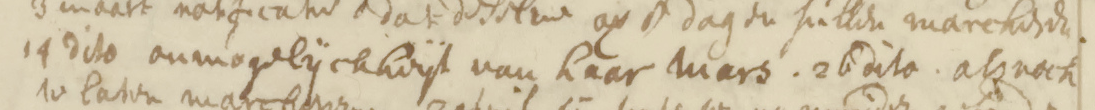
14 dito onmogelijckheijt van haar Mars. 26 dito, alsnoch
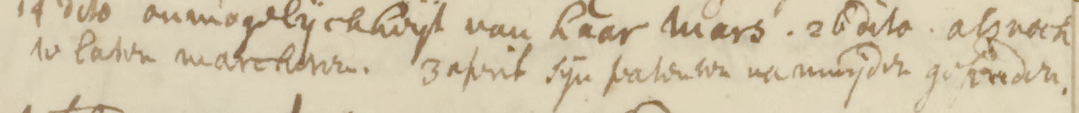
te laten marcheren. 3 april sijn patenten na muijden gesonden.
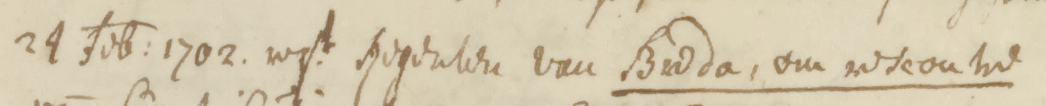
24 feb: 1702. reqt. Regenten van Breda, om ?
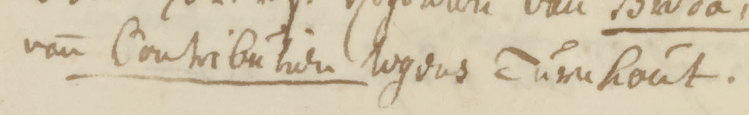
van Contributien wegens Turnhout.
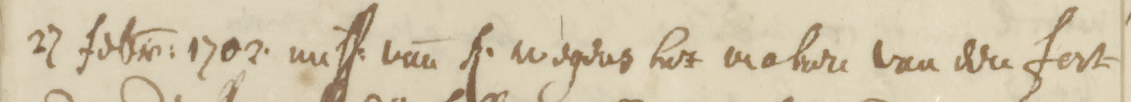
27 febr: 1702 miss: van R. wegens het maken van een Fort
